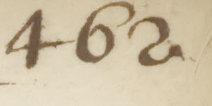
462
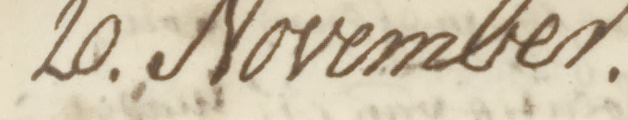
20. November.
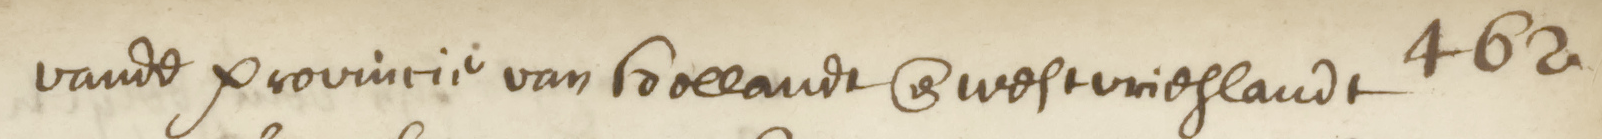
vande provincie van hollandt en westvrieslandt
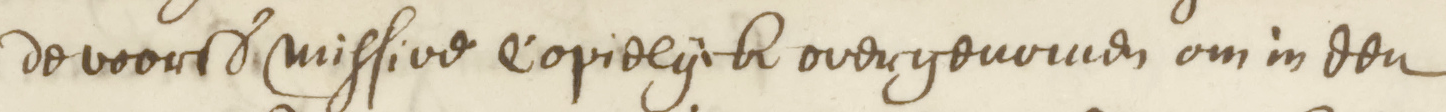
de voors missive copielijck overgenomen om in den
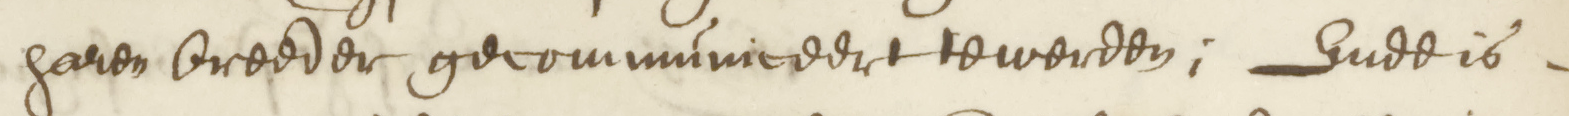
haren breeder gecommuniceert te werden: Ende is
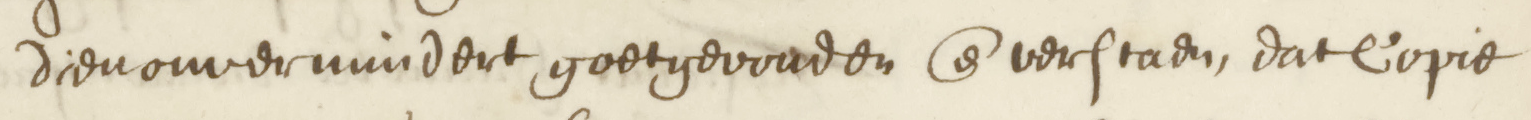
dien onvermindert goetgevonden en verstaen, dat Copie
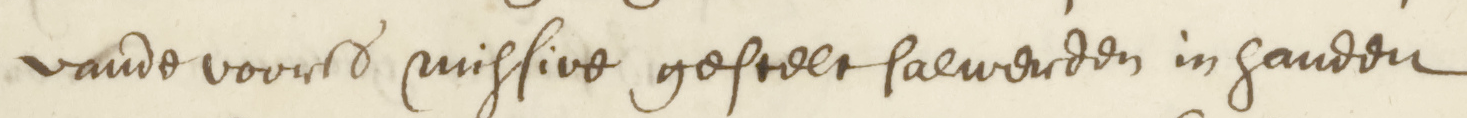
vande voors missive gestelt sal werden in handen
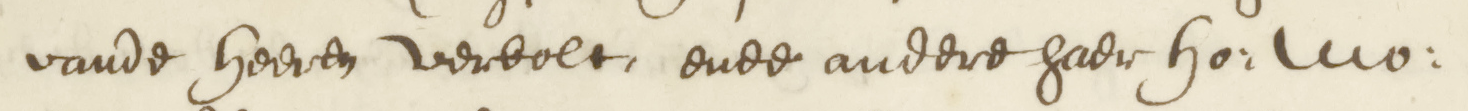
vande heeren verbolt, ende andere haer Ho:Mo:
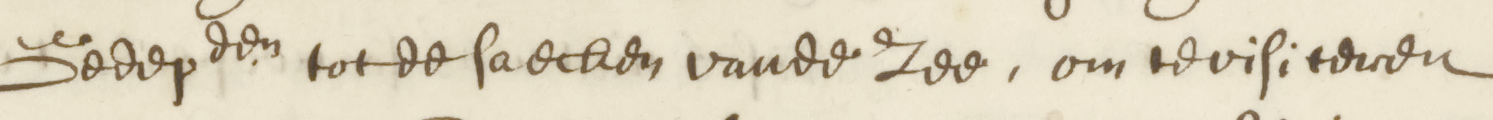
Gedepden. tot de saecken vande Zee, om te visiteren
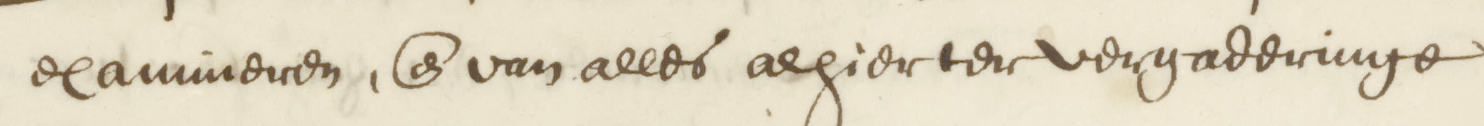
examineren, en van alles alhier ter vergaderinge
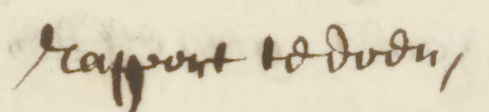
rapport te doen.
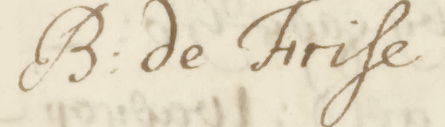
B: de Frise
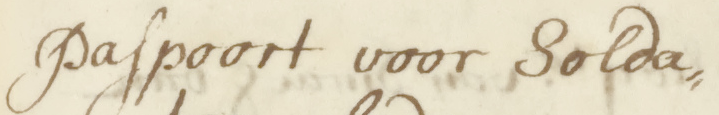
Paspoort voor Solda„
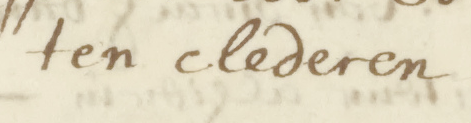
ten clederen
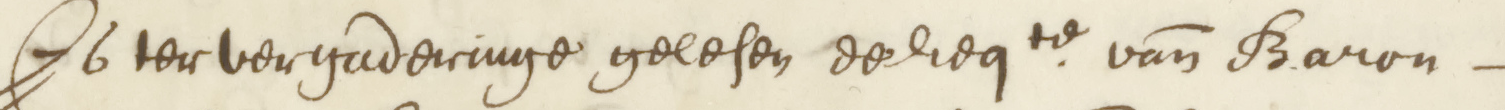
Is ter vergaderinge gelesen de reqte. van Baron
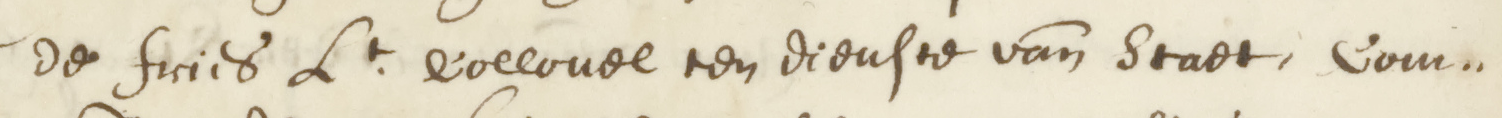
de Fries Lt. Collonel ten dienste van Stadt, Com„
